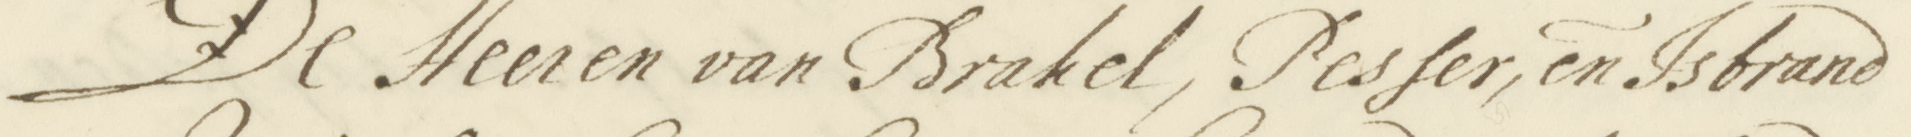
De Heeren van Brakel, Pesser, en Isbrand
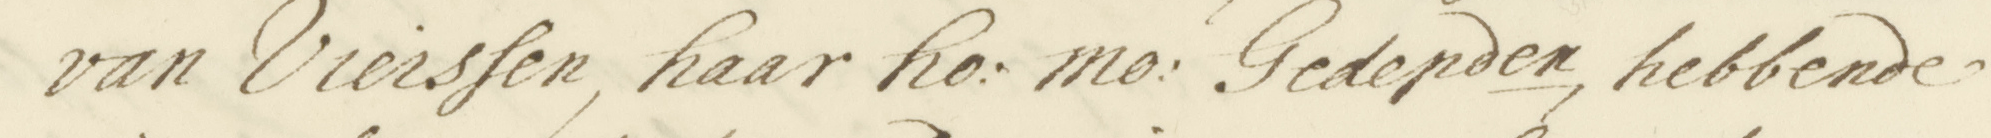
van Vierssen, haar ho:mo: Gedepden, hebbende
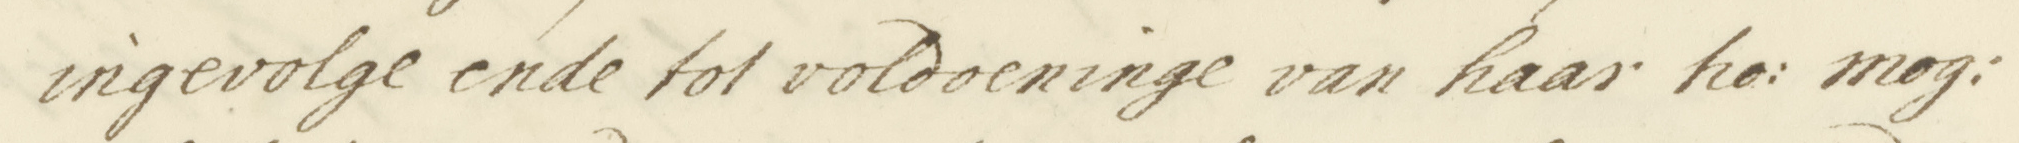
ingevolge ende tot voldoeninge van haar ho:mog:
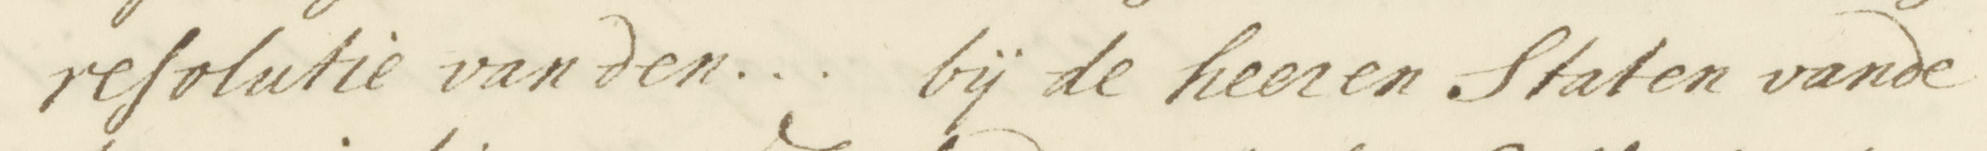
resolutie vanden ... bij de heeren Staten vande
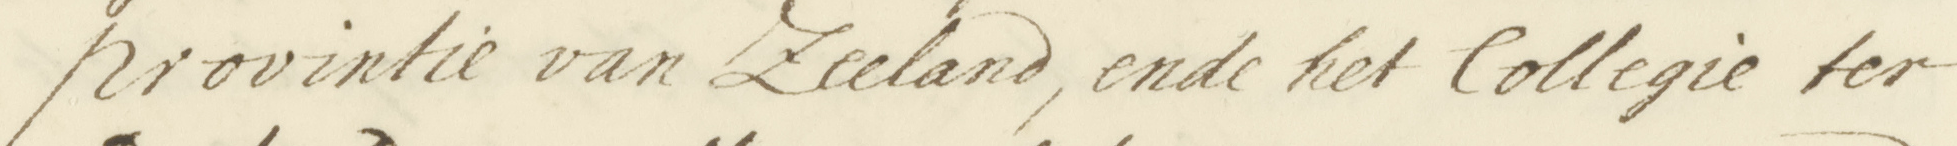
provintie van Zeeland, ende het Collegie ter
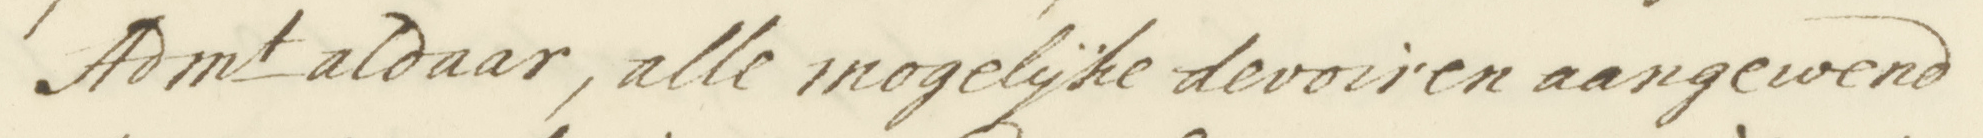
Admt. aldaar, alle mogelijke devoiren aangewend
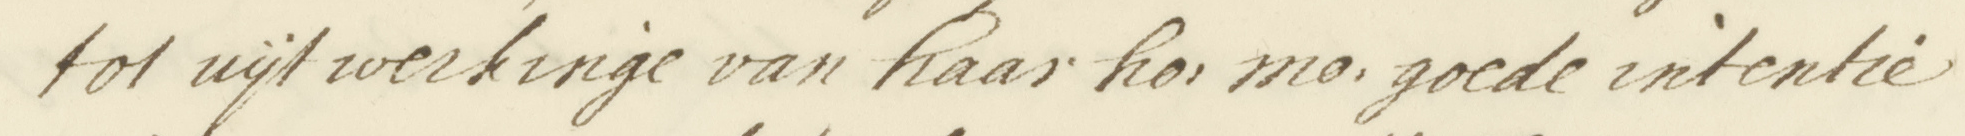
tot uijtwerkinge van haar ho:mo: goede intentie
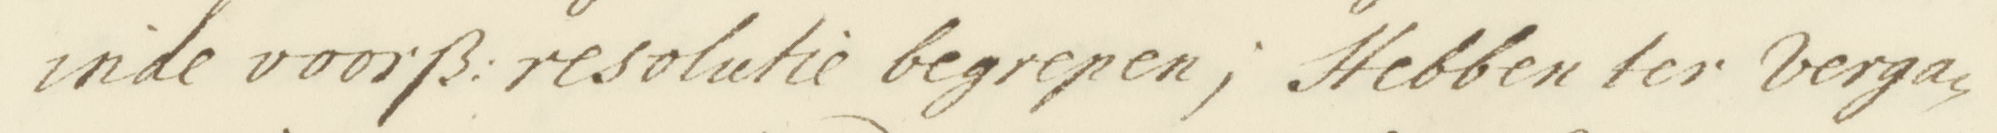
inde voors: resolutie begrepen; Hebben ter verga,,
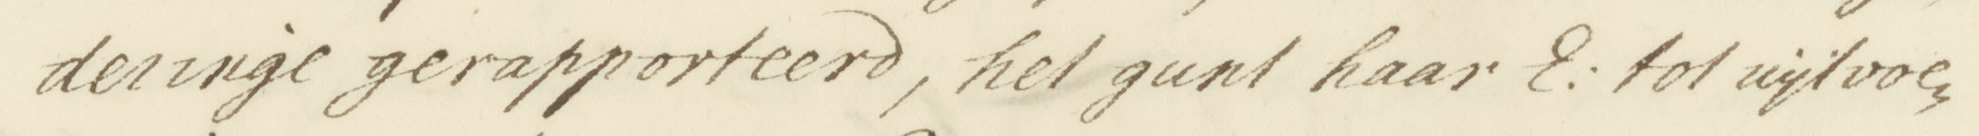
deringe gerapporteerd, het gunt haar E. tot uijtvoe„
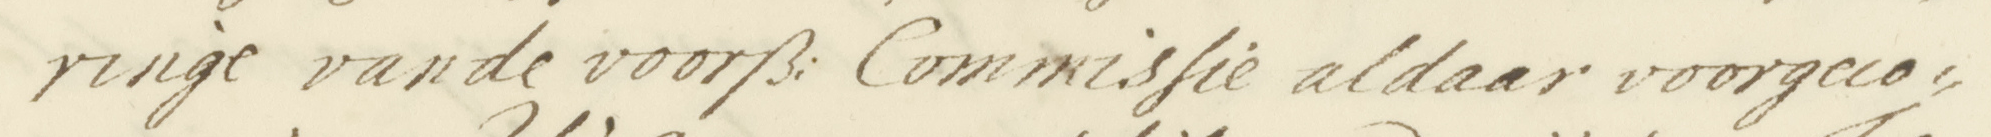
ringe vande voors: Commissie aldaar voorgeco„
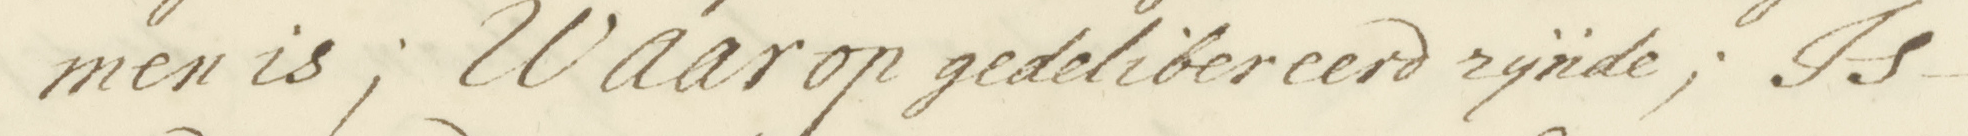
men is; Waarop gedelibereerd zijnde; is
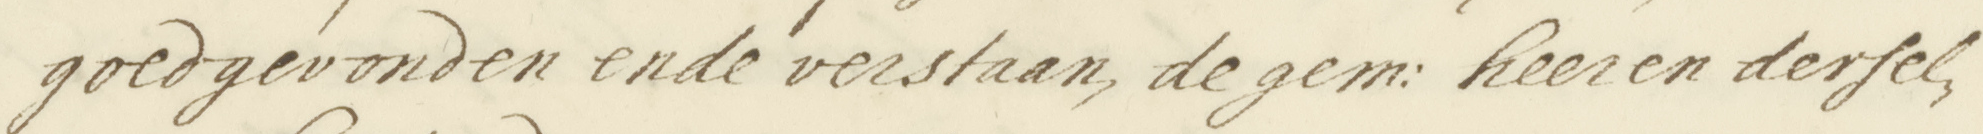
goedgevonden ende verstaan, de gem: heeren dersel
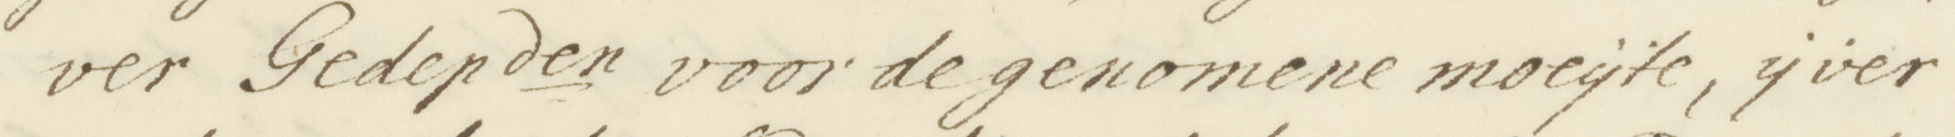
ver Gedepden voor de genomene moeijte, ijver
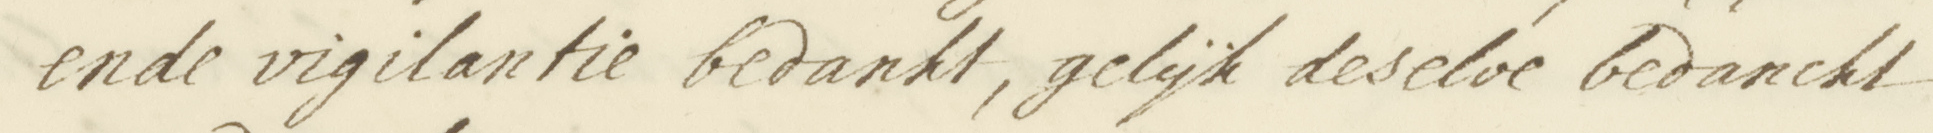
ende vigilantie bedankt, gelijk deselve bedanckt
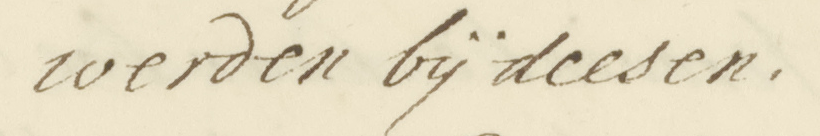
werden bij deesen.
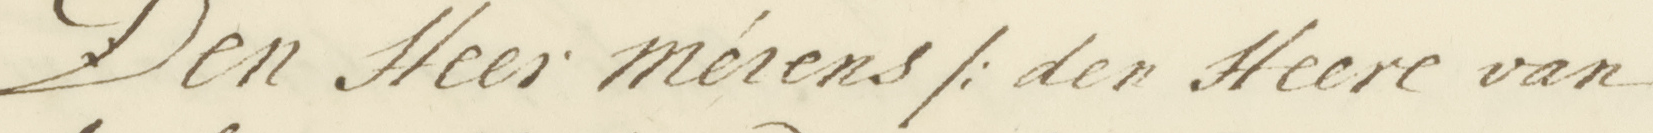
Den Heer Merens (: den Heere van
